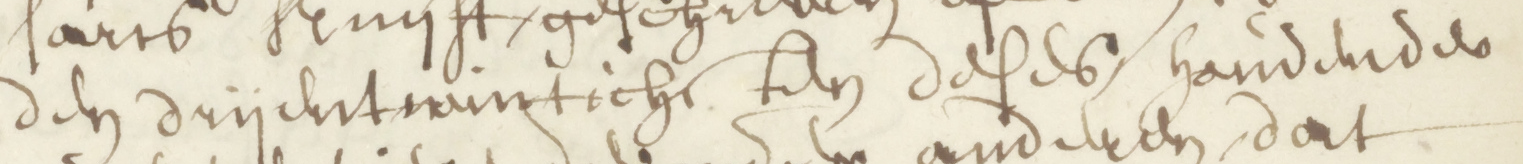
den drijentwintichsten deses, houdende
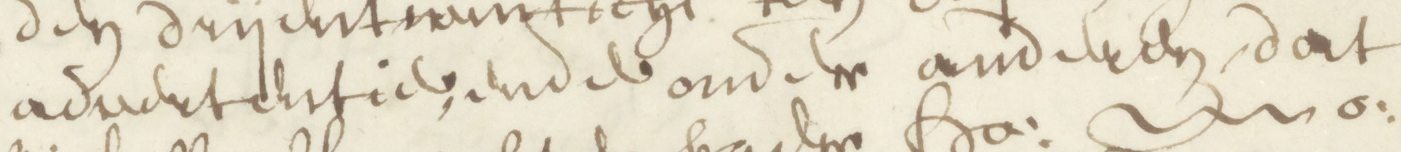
advertentie, ende onder anderen, dat
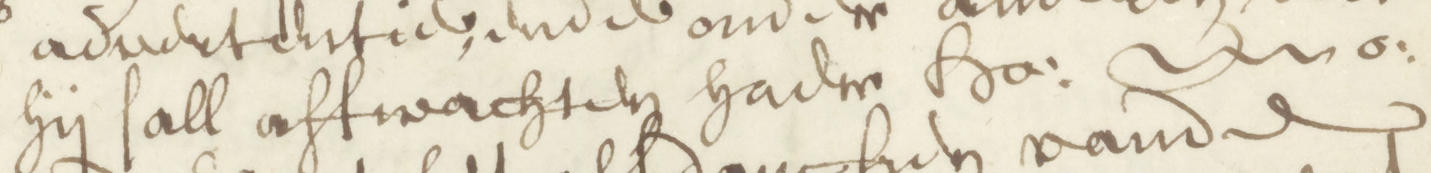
hij sall affwachten haer Ho:Mo:
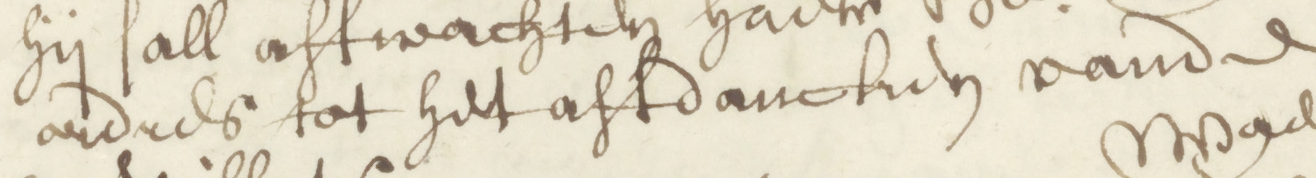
ordres tot het affdancken vande
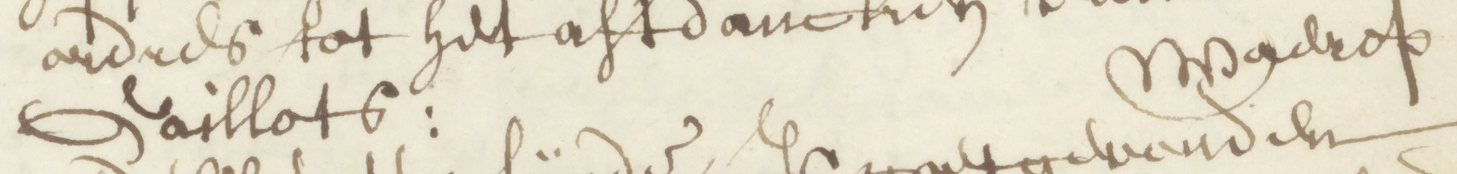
Gaillots: Waerop
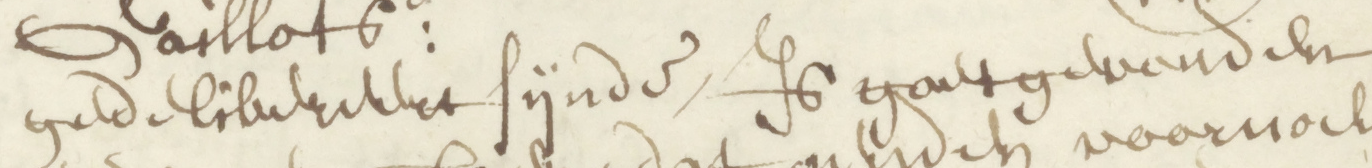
gedelibereert sijnde, Is goetgevonden
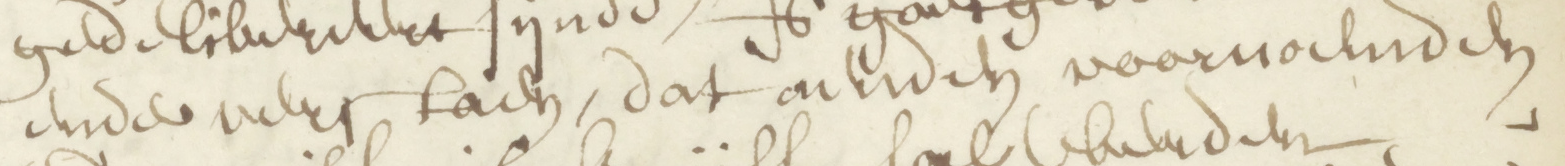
ende verstaen, dat aenden voornoemden
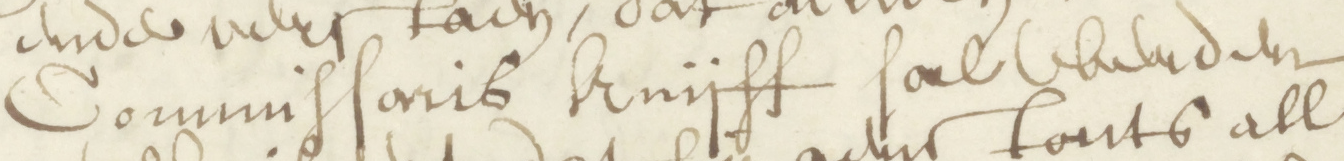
Commissaris Kuijff sal werden
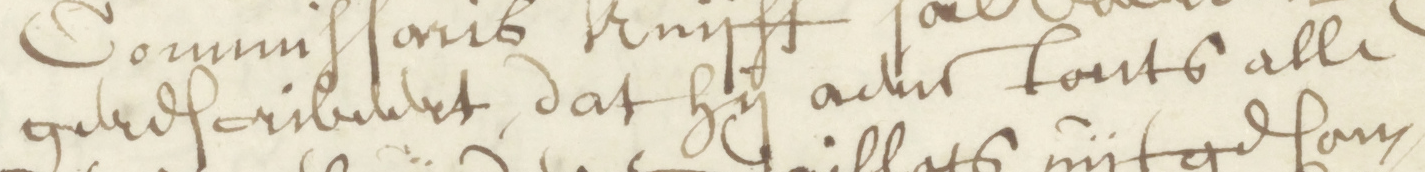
gerescribeert dat hij aenstonts alle
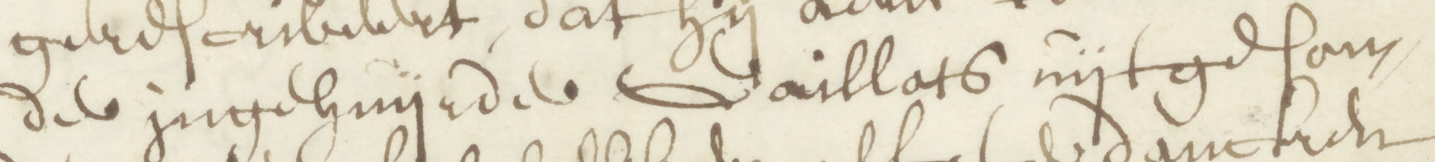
de ingehuijrde Gaillots uijtgeson„
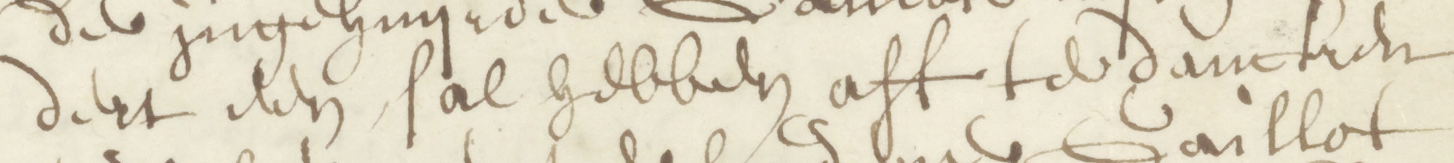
dert een sal hebben aff te dancten
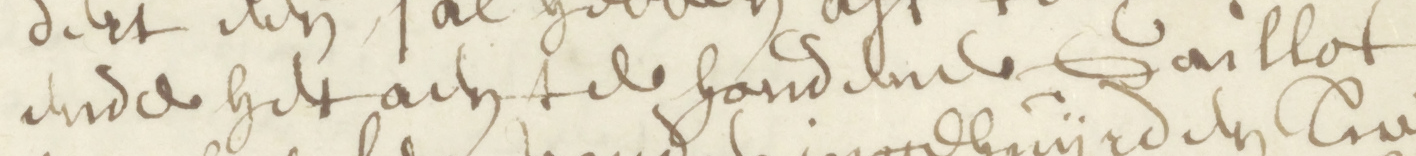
ende het aen te houdene Gaillot
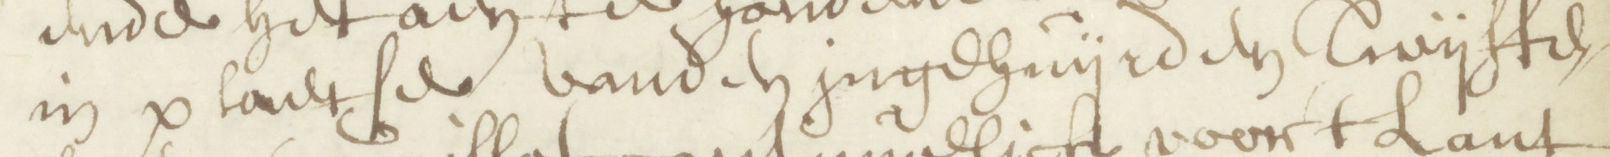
in plaetse vanden ingehuijrden Twijffe,,
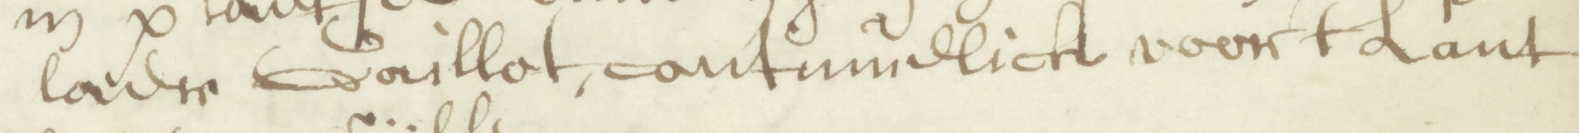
laer Gaillot, continuelick voor't Lant
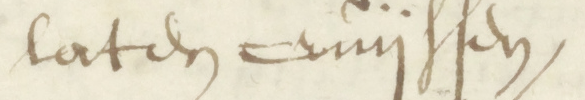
laten cruijssen.
